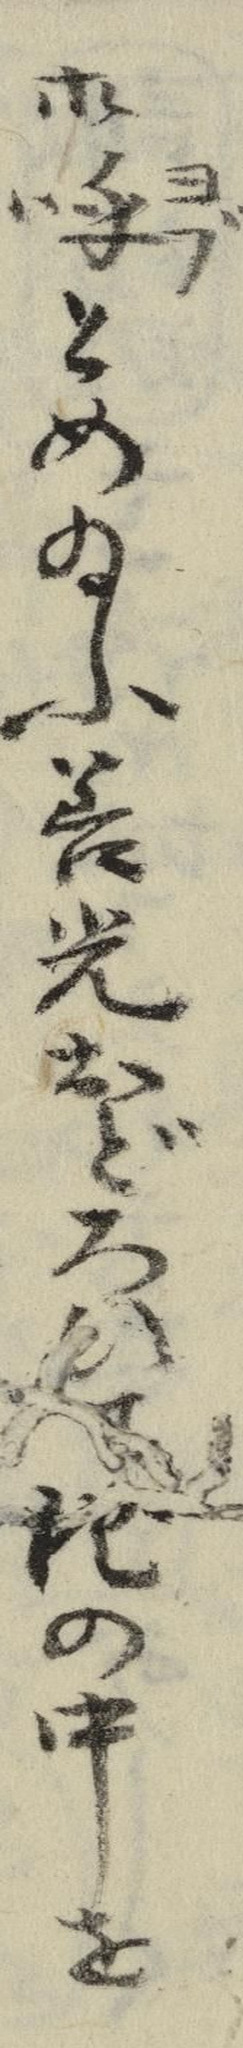御呼とめ給ふ善光おどろひて池の中を
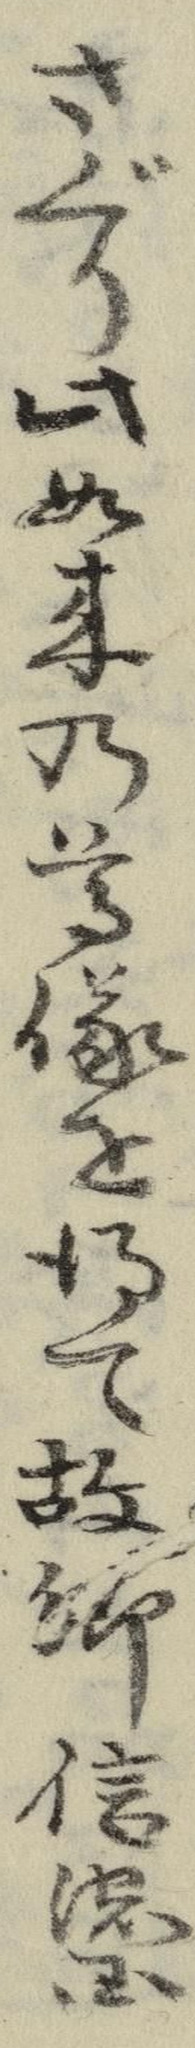さぐり此如来乃尊像を得て故郷信濃国
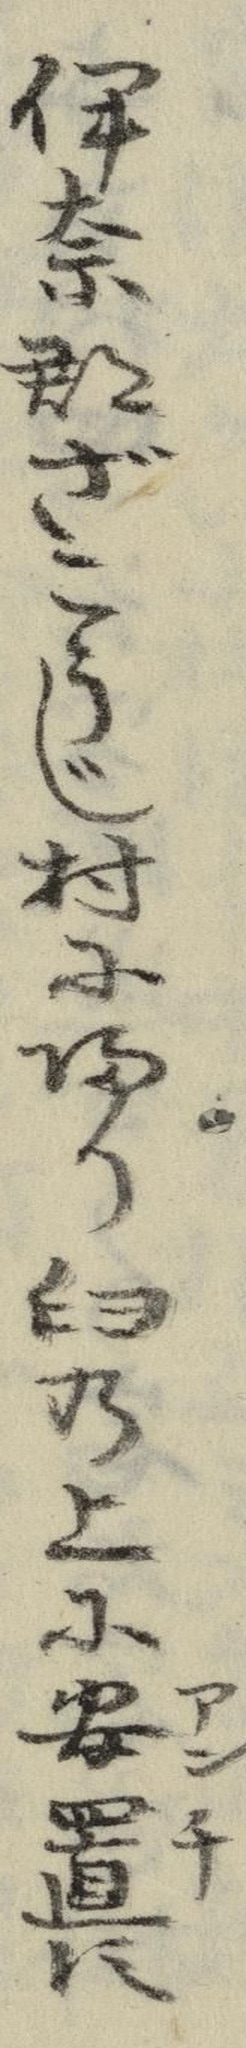伊奈郡ざこうじ村に帰り𦥑乃上に安置す
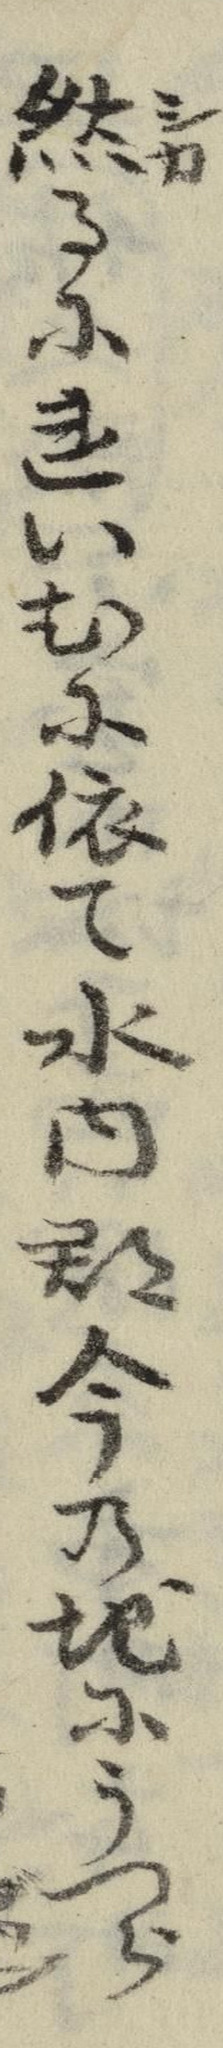然るにれいむに依て水内郡今乃地にうつら
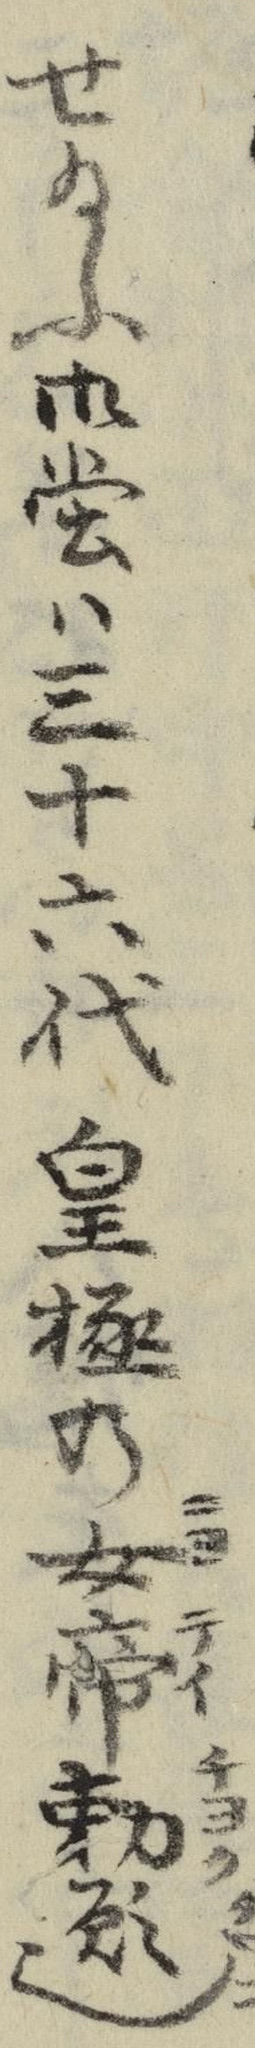せ給ふ御堂ハ三十六代皇極乃女帝勅願也
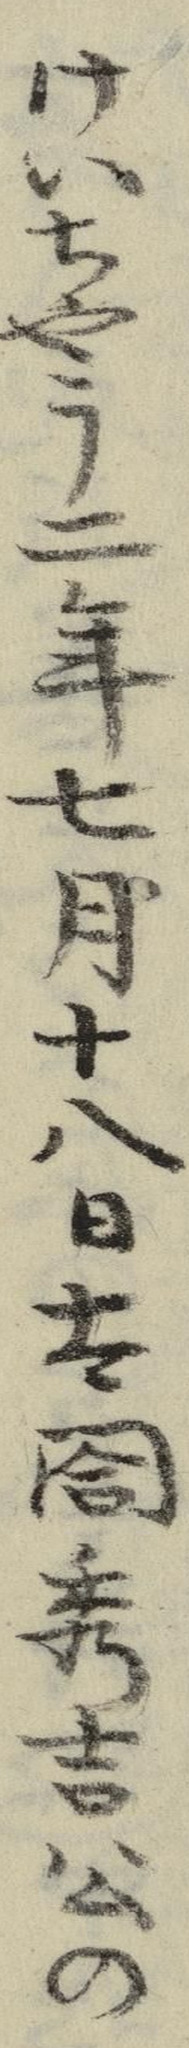けいちやう二年七月十八日太閤秀吉公の
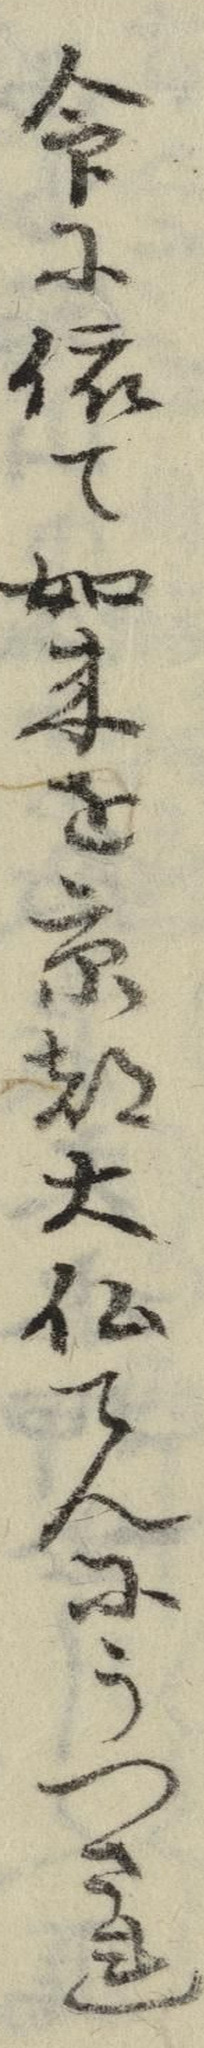令に依て如来を京都大仏てんにうつされ
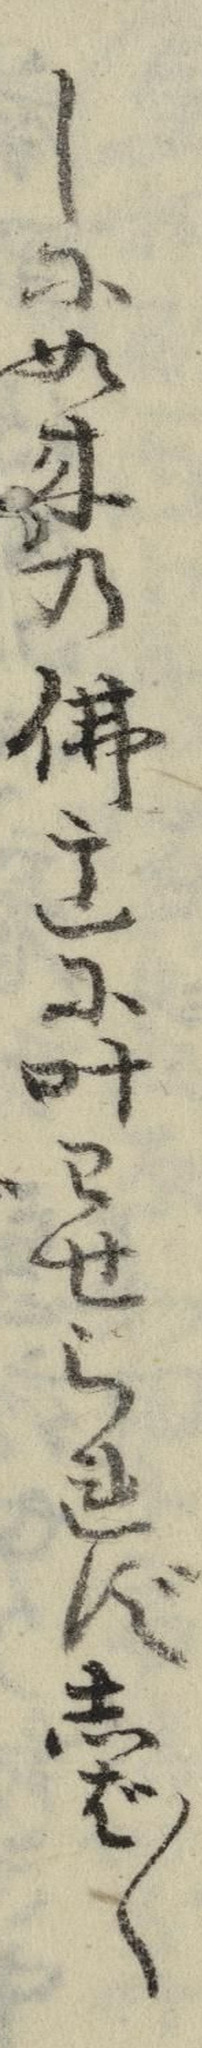しに如来乃仏意に叶わせられずしば〳〵
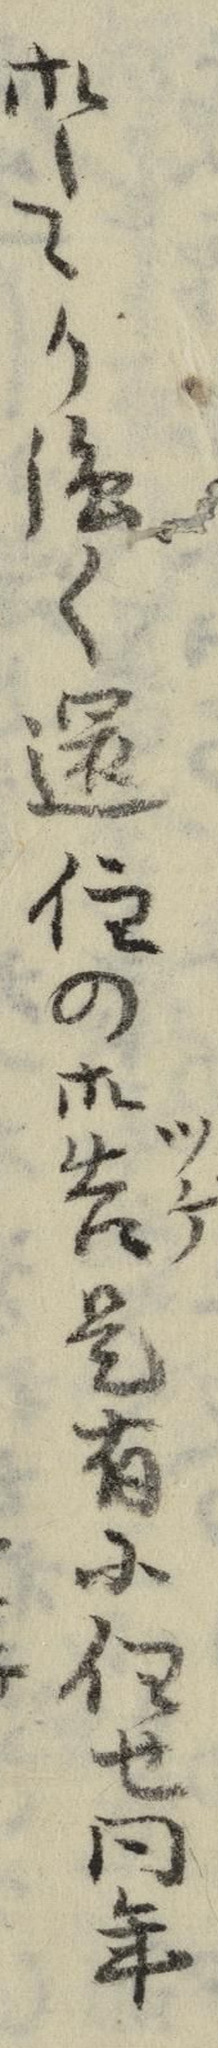御しかり強く還住の御告是有に任せ同年
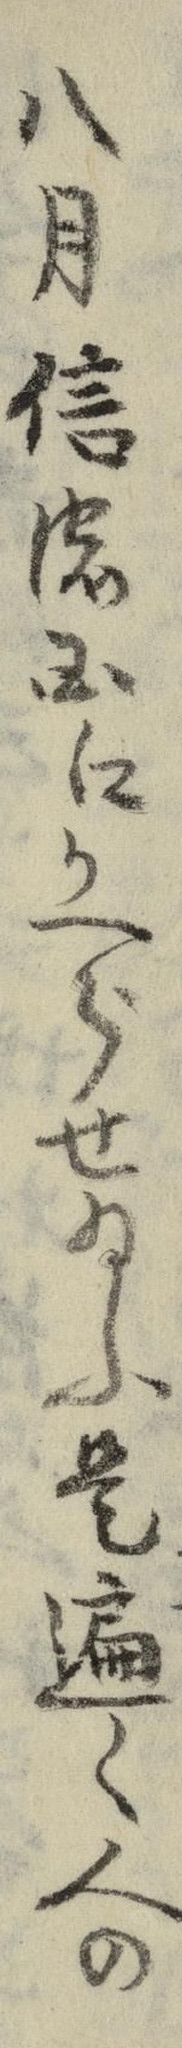八月信濃国えかヘらせ給ふ是遍く人の

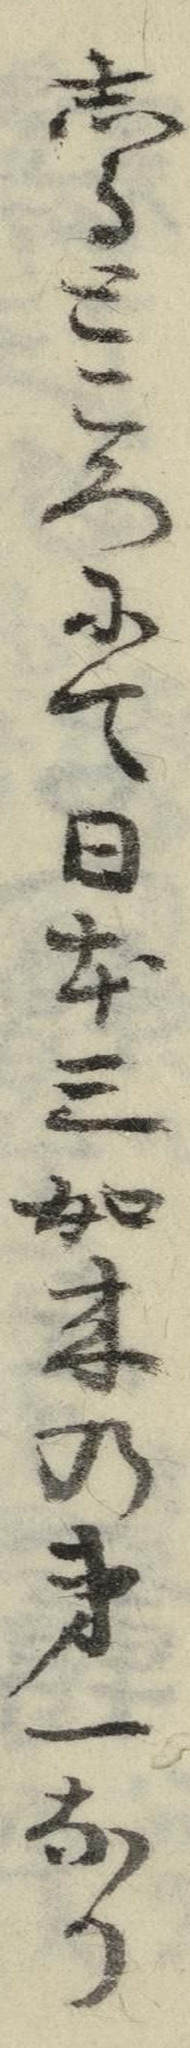しるところにて日本三如来乃第一なり
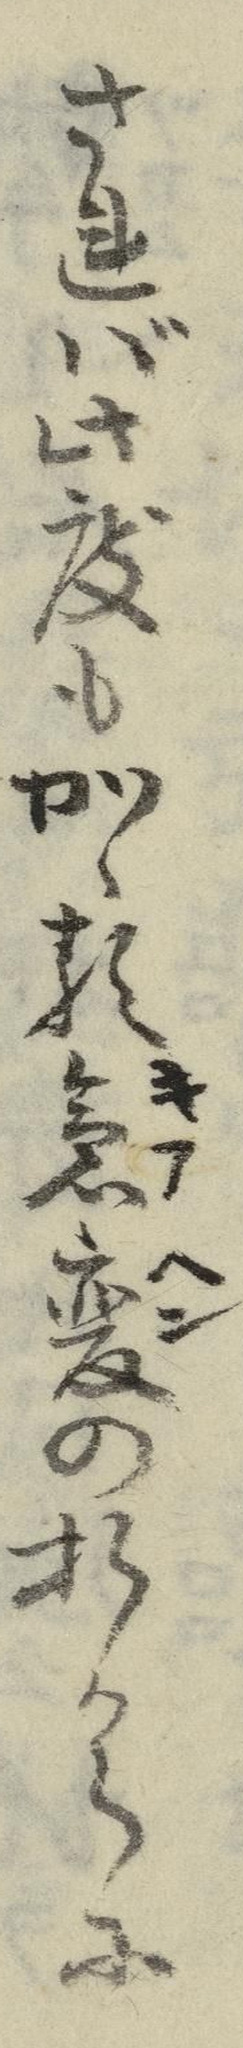されバ此度もかゝる急変の折からに
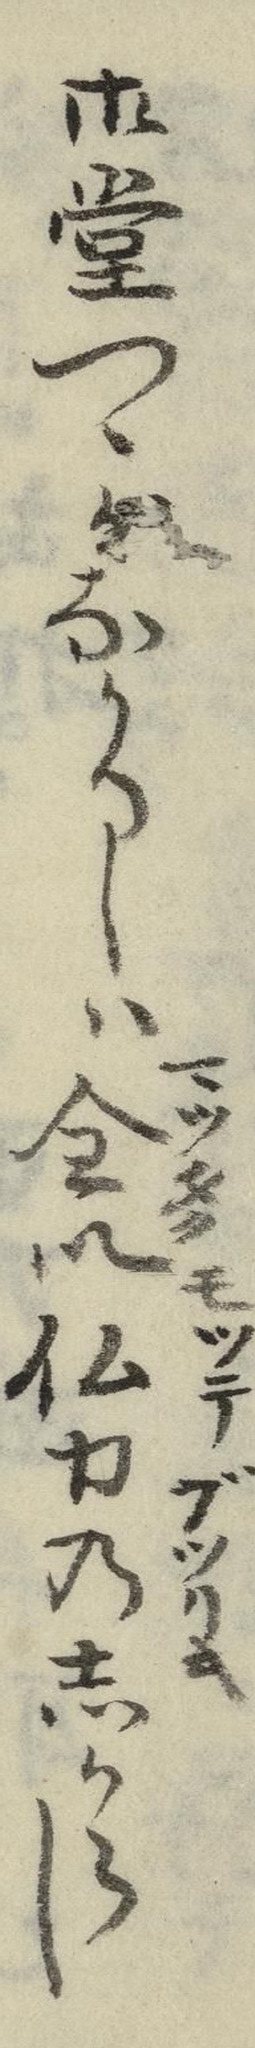御堂つゝかなかりしハ全以仏力乃しからし
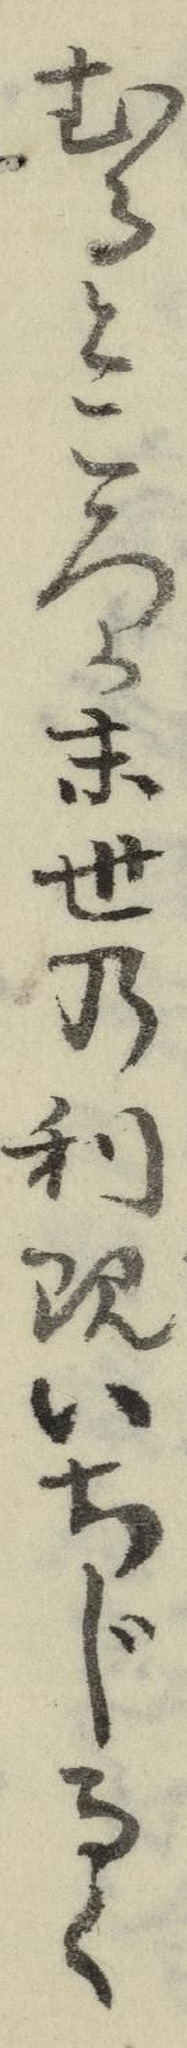むるところか末世乃利現いちじるく
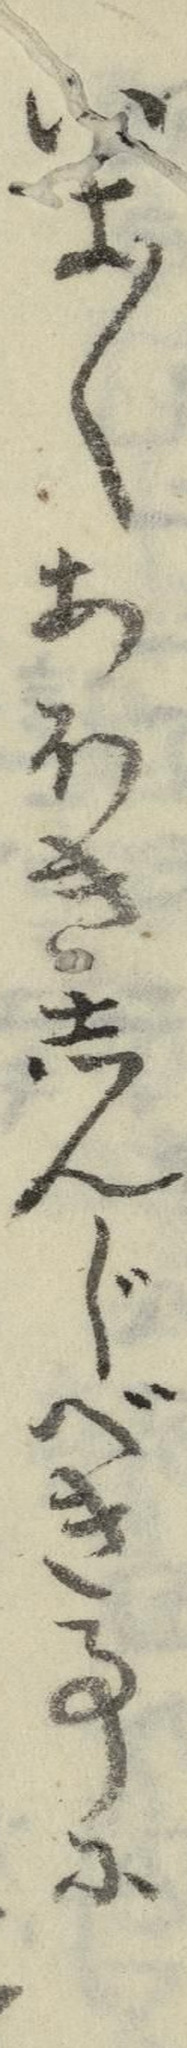いよ〳〵あほきしんじべき事にこそ
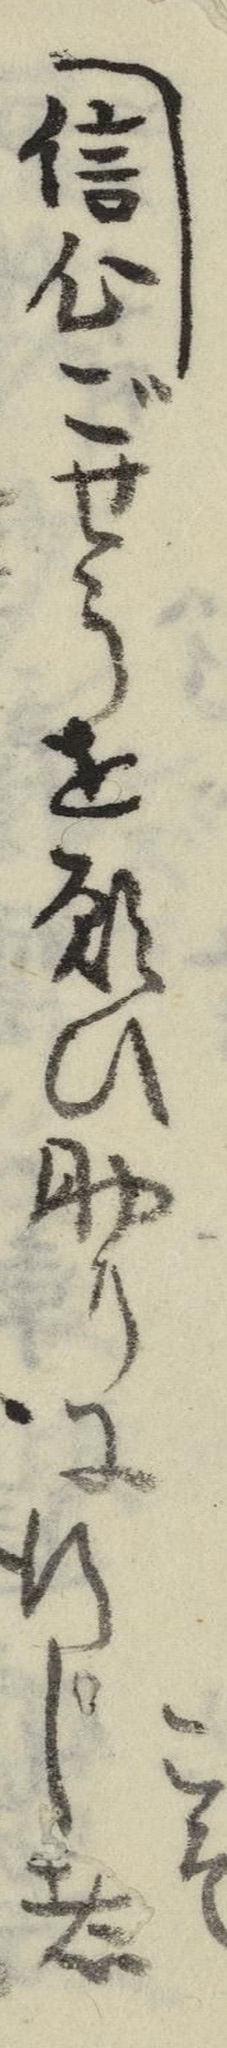信心ごせうを願ひ助りに行し者
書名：信州大地震一件之冩　丁未弘化四年三月吉日
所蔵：東京大学地震研究所図書室 Earthquake Research Institute Library, The University of Tokyo, JAPAN
